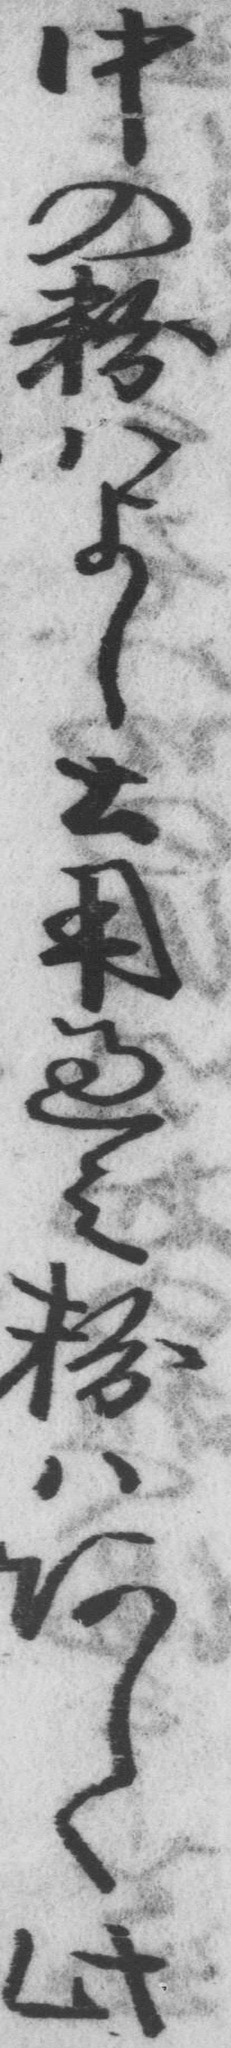中の粉はよし土用過之粉はあしく此
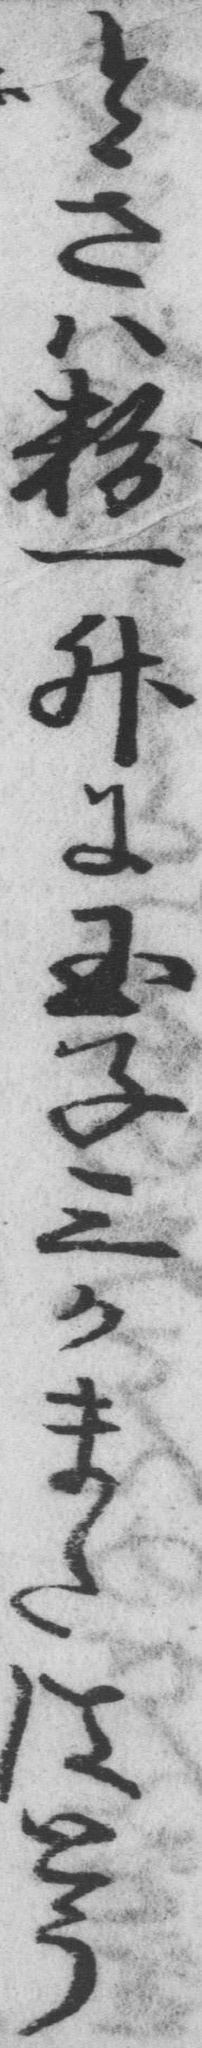ときは粉一升に玉子三かまたはとう
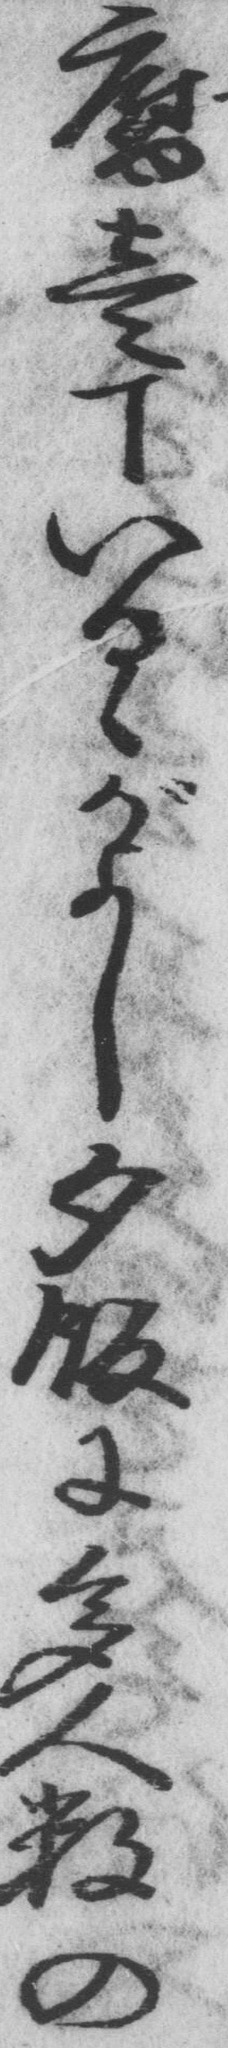腐壱丁いるゝがよし夕飯に多人数の
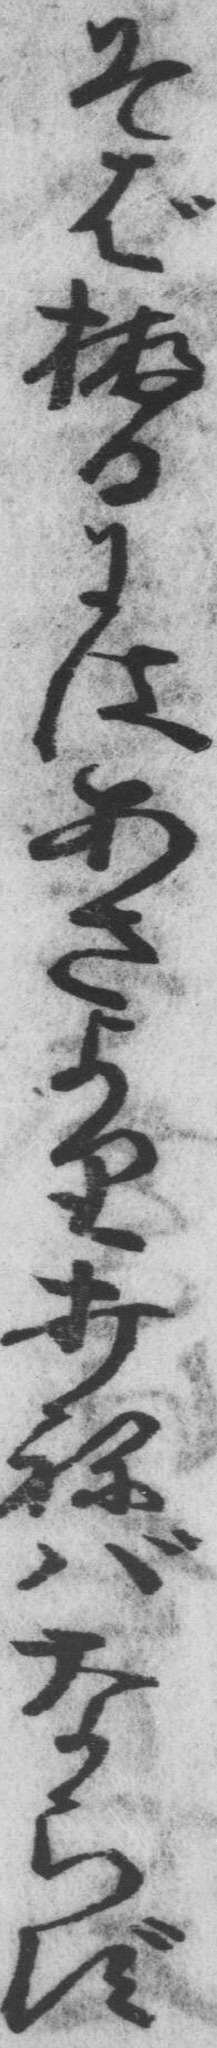そば拵るにはあさより打ねばならず
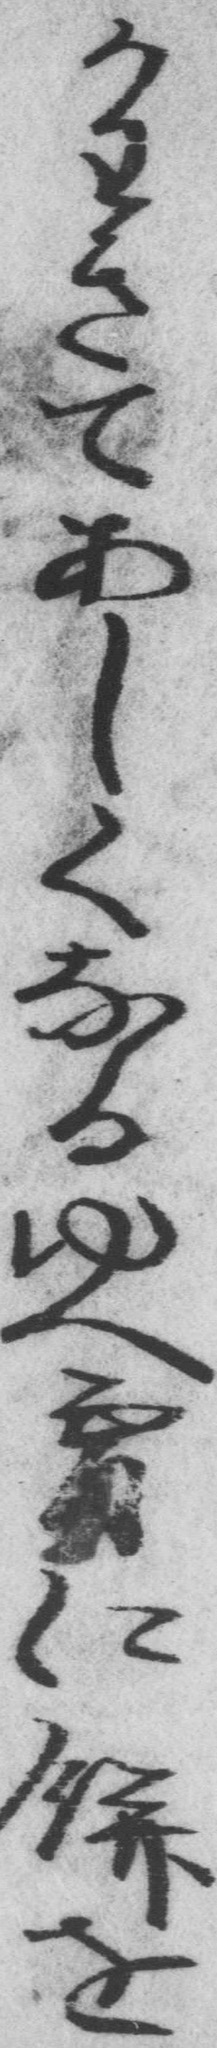かわきてあしくなるゆへ宵に餅を
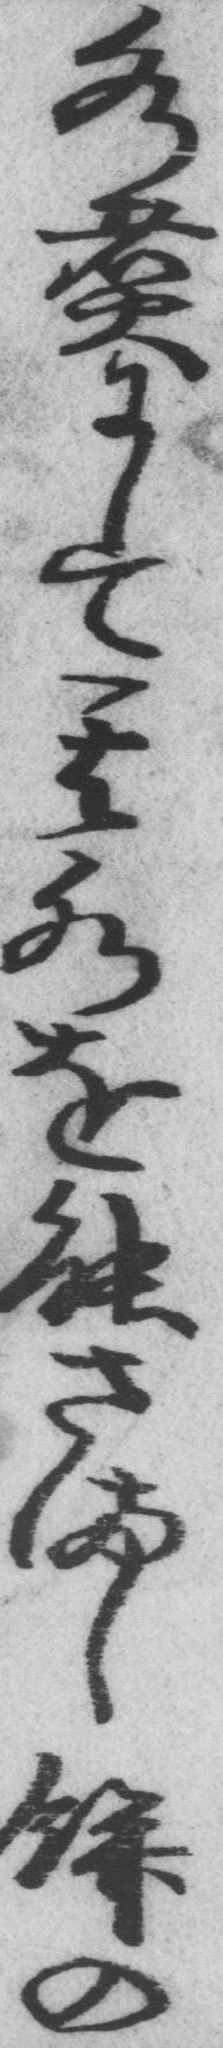水煮にして其水を能さまし餅の
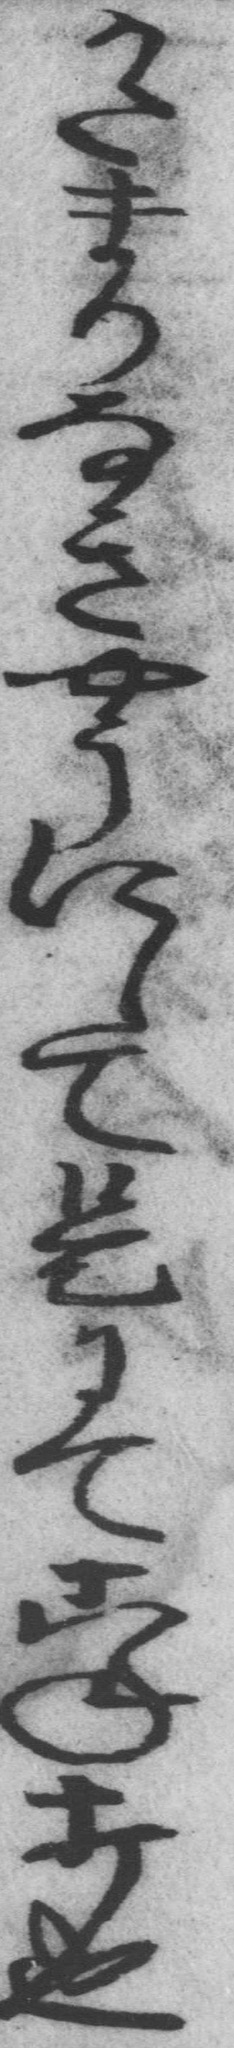かたまりなきやうにして是にてこね打也

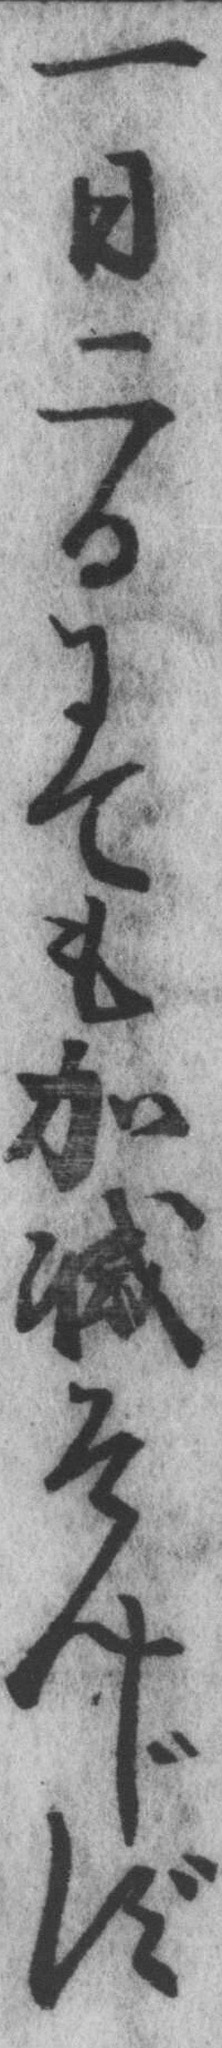一日二日にても加減そんじず
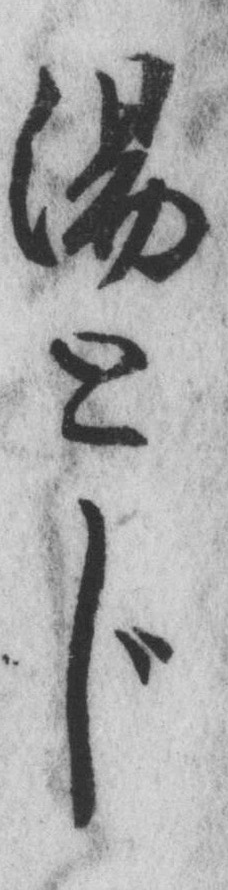湯とじ
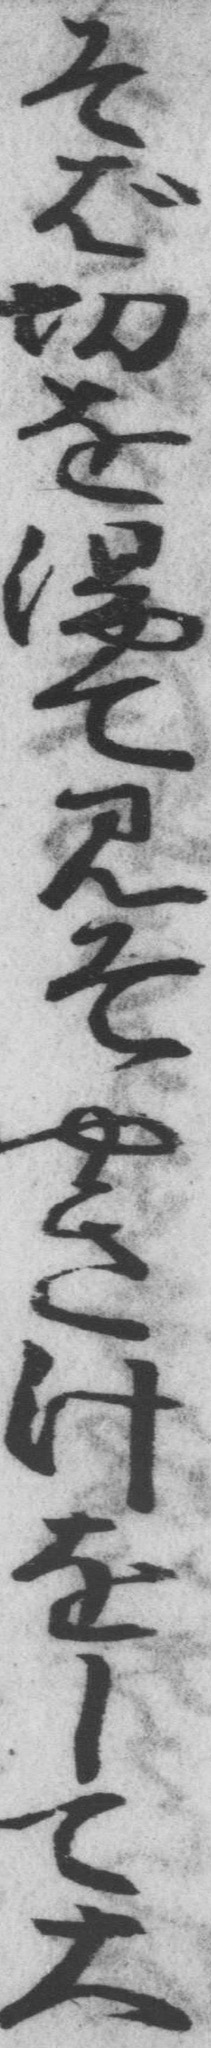そば切を湯てみそやき汁をして大
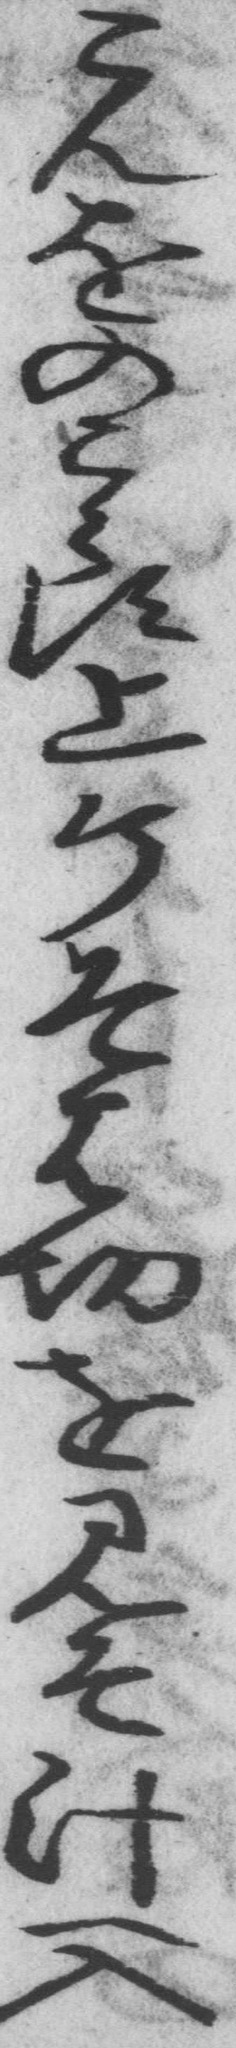こんをのこらす上けそは切をみそ汁へ入
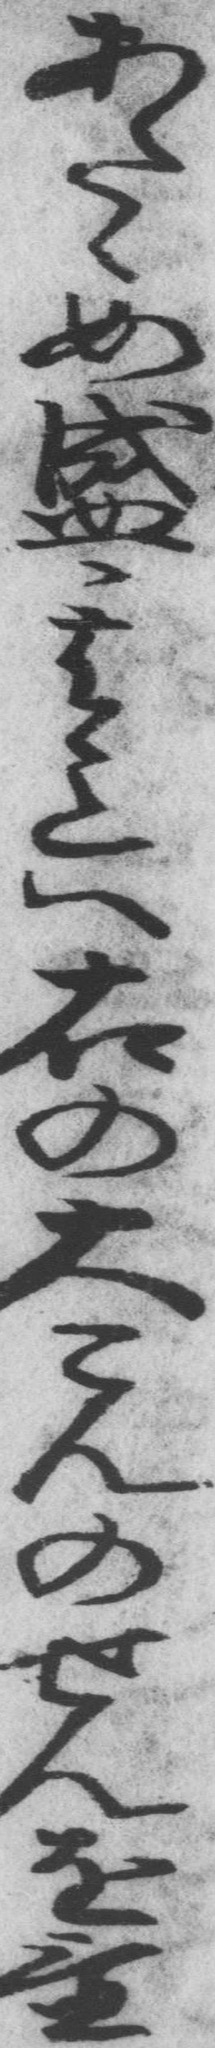あたゝめ盛其上へ右の大こんのせんを置
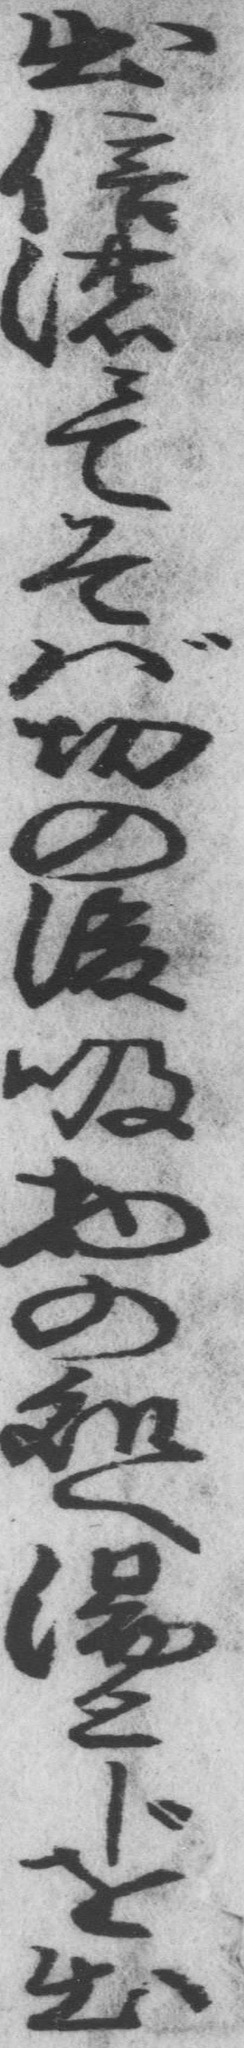出信濃にてそば切の後吸物の処へ湯とじを出
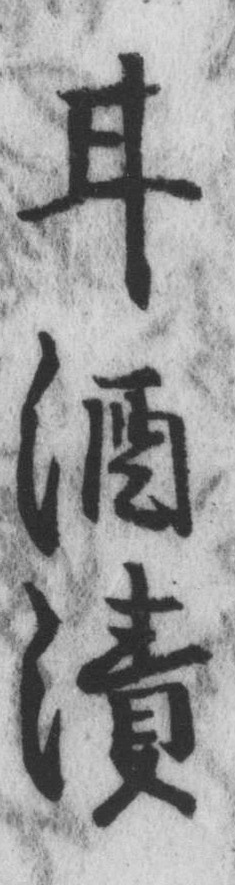甘酒漬
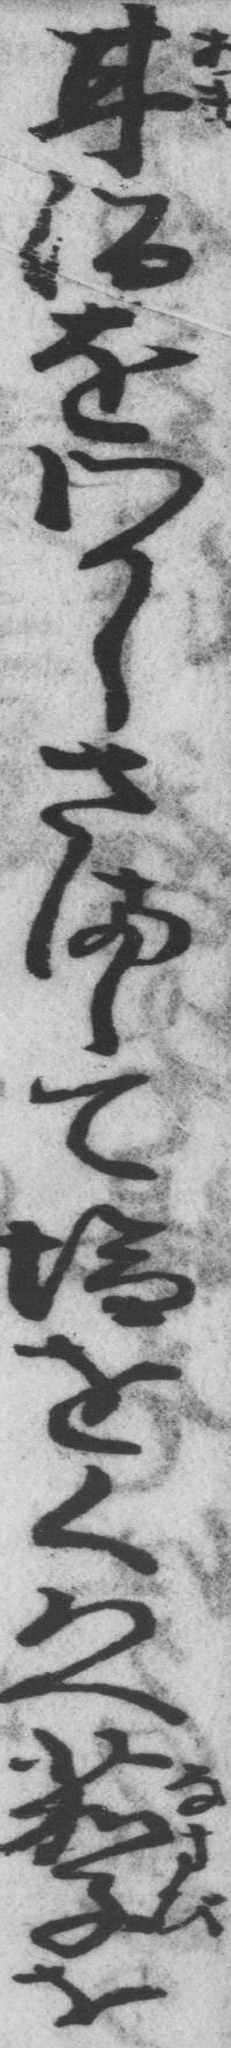甘酒をわかしさまして塩をくはへ茄子を
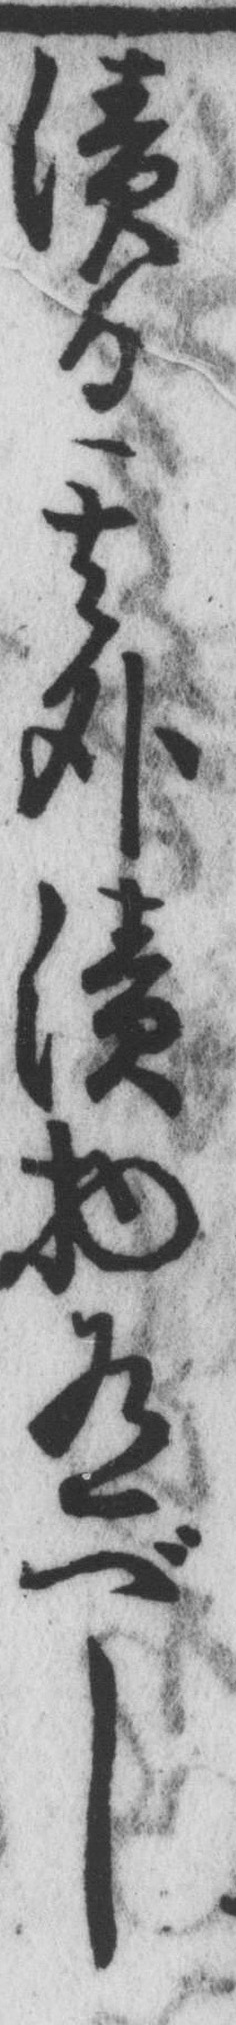漬る其外漬物有べし
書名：料理山海郷
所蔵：大阪府立大学学術情報センター 国文学研究資料館
